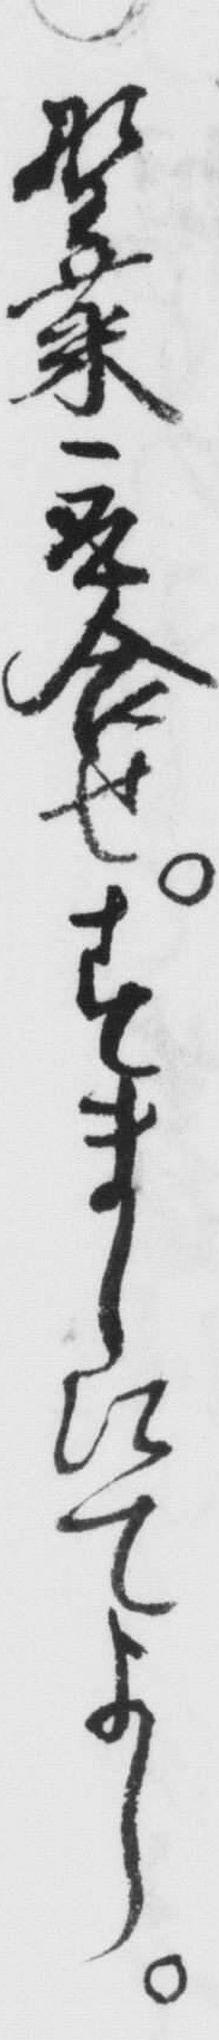○野菜取合せ。すましにてよし。
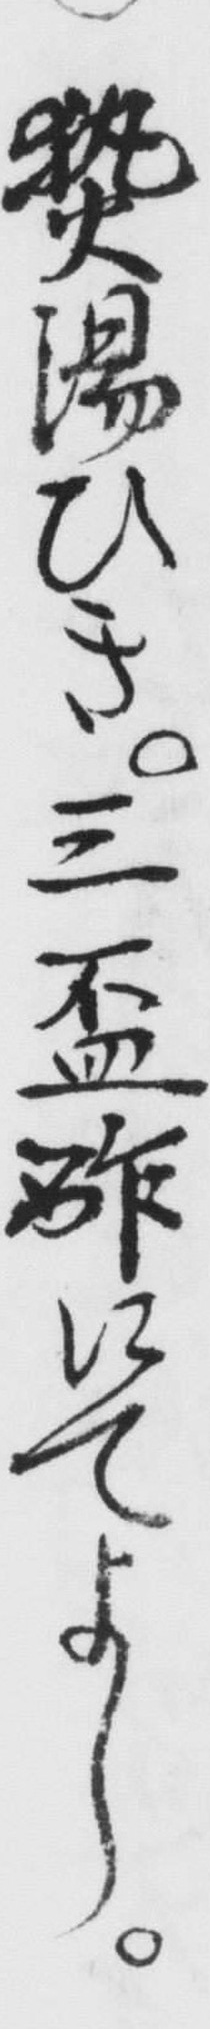○熱湯ひき。三盃酢にてよし。
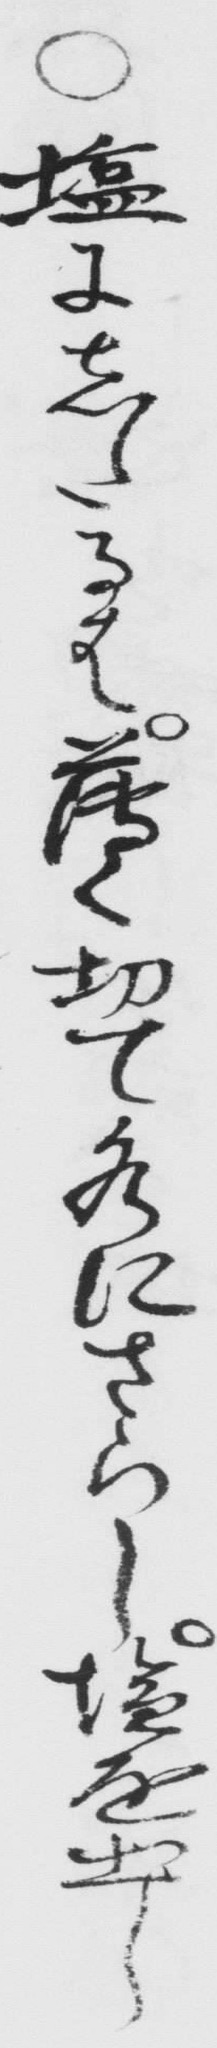○塩にしたるは。薄く切て水にさらし。塩を出し
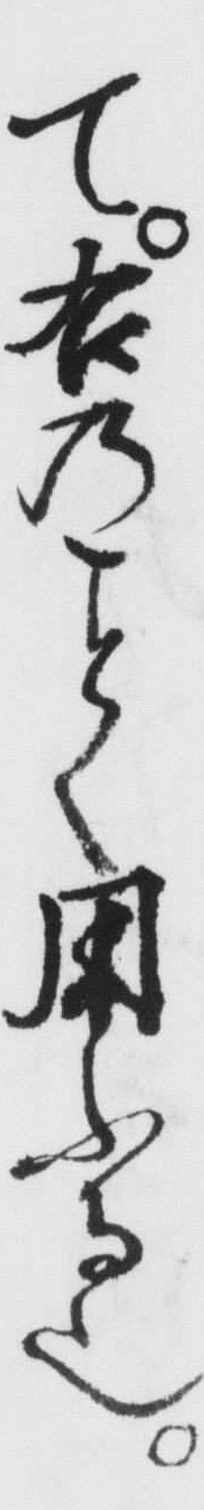て。右のことく用ふる也。
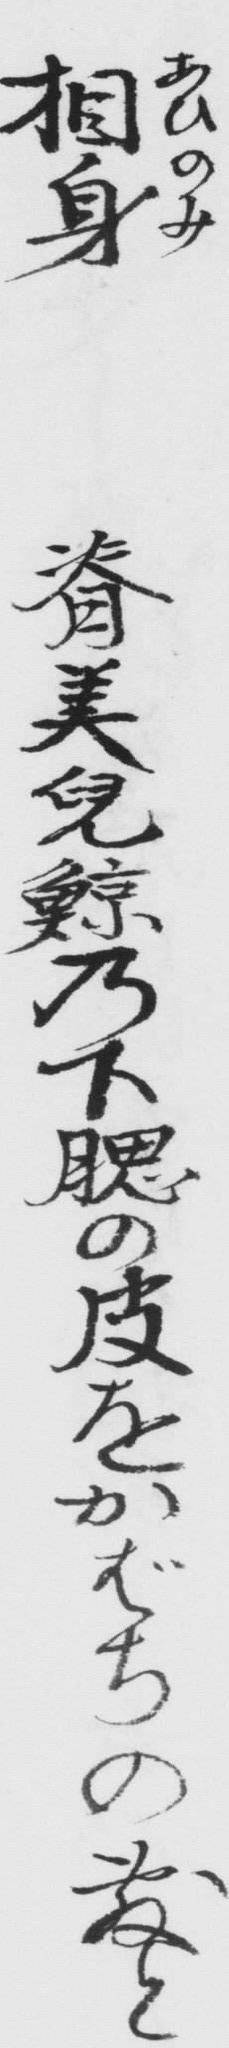相身背美児鯨の下腮の皮をかばちの敷と

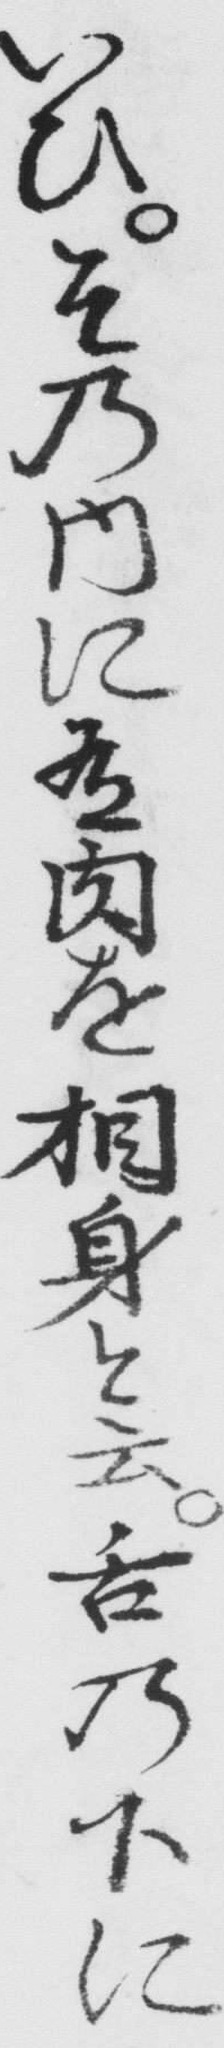いひ。その内に有肉を相身と云。舌の下に
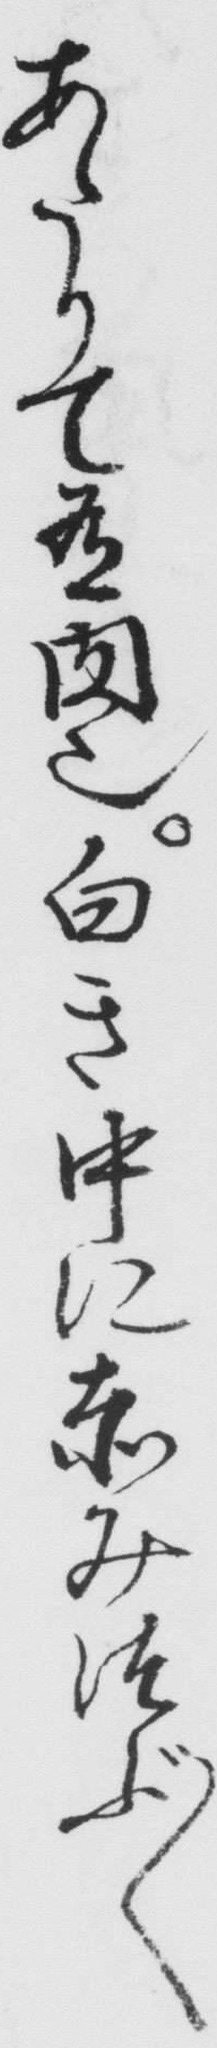あたりて有肉也。白き中に赤みつぶ〳〵
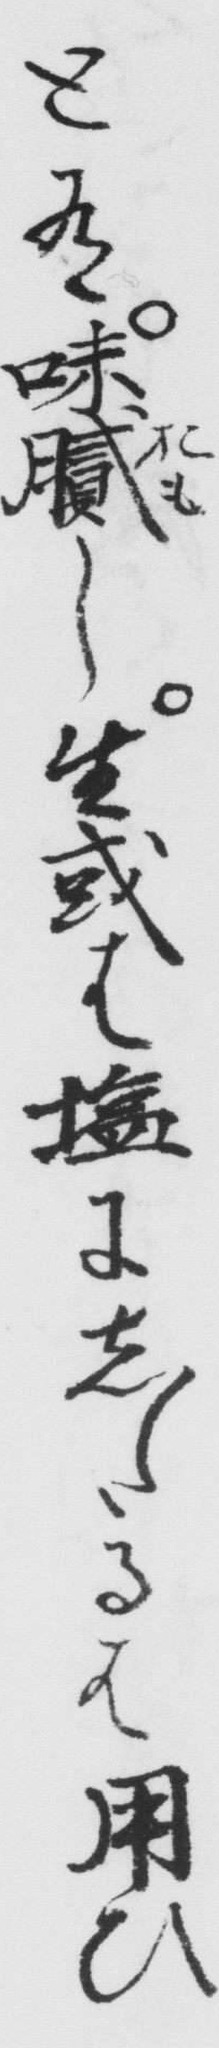と有。味膩し。生或は塩にしたるは用ひ
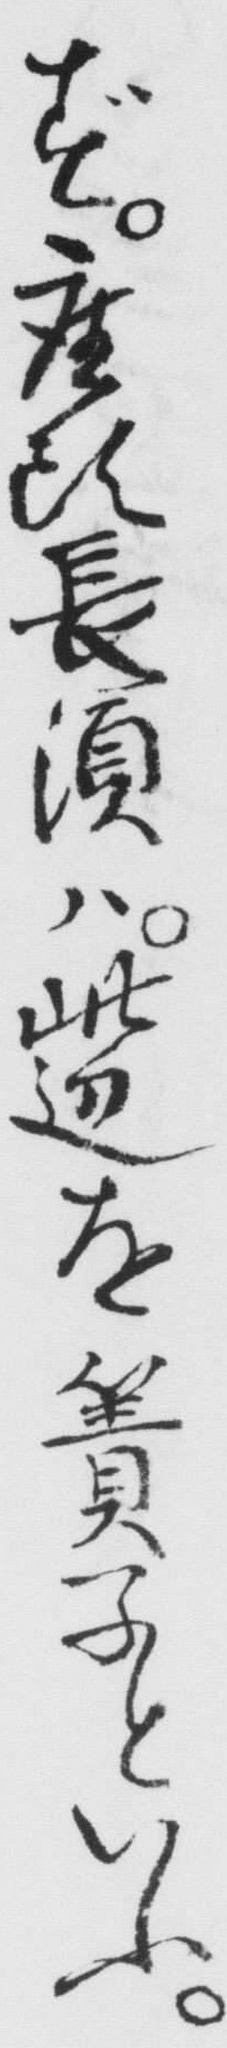ず。座頭長須は。此辺を簀子といふ。
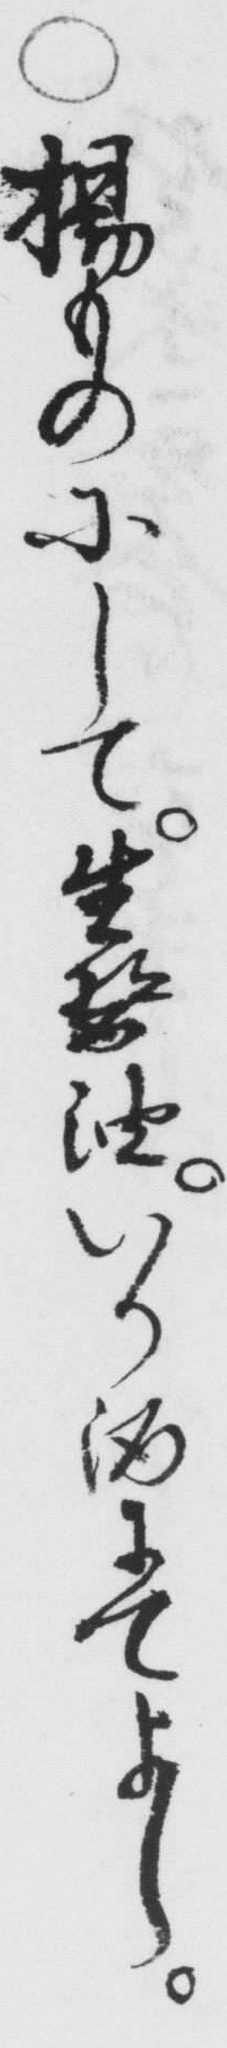○揚ものにして。生醤油。いり酒にてよし。
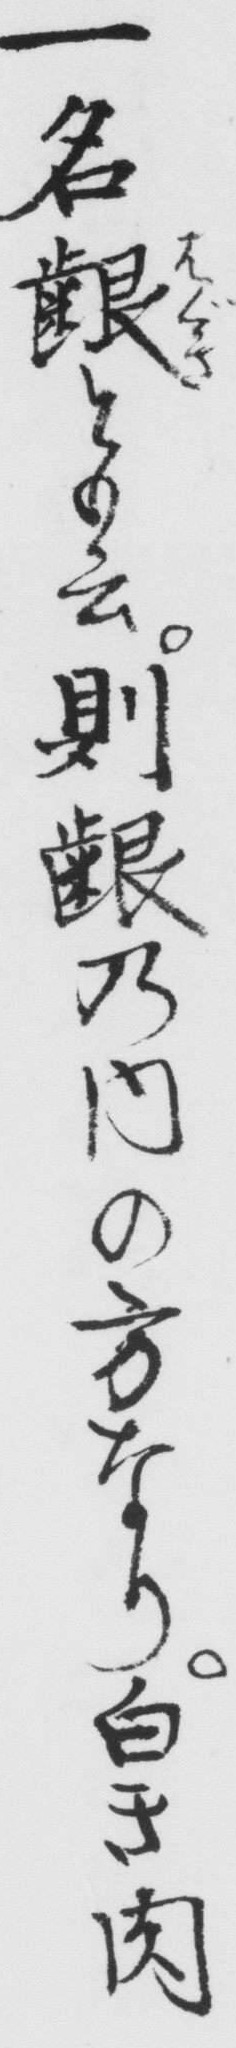小髭一名齦とも云。則齦の内の方なり。白き肉
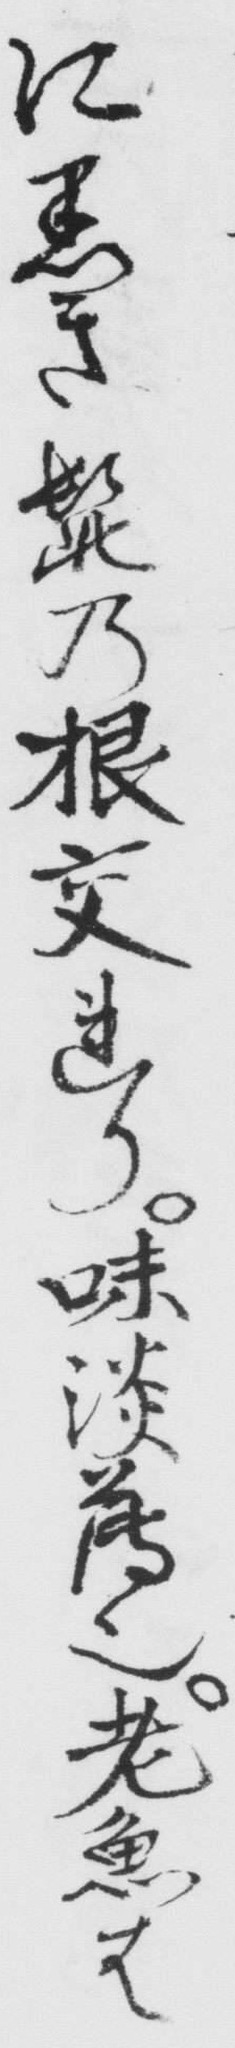に黒き髭の根交れり。味淡薄也。老魚は
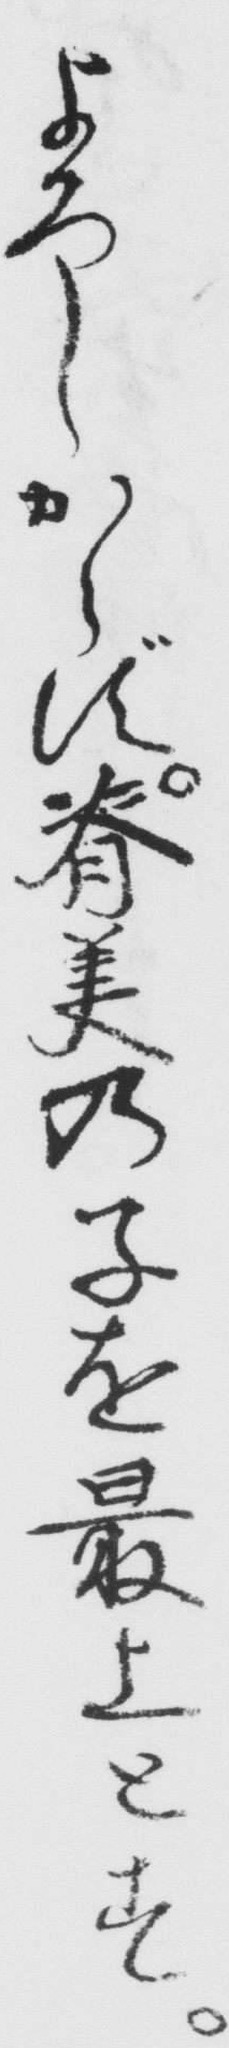よろしからず。背美の子を最上とす。
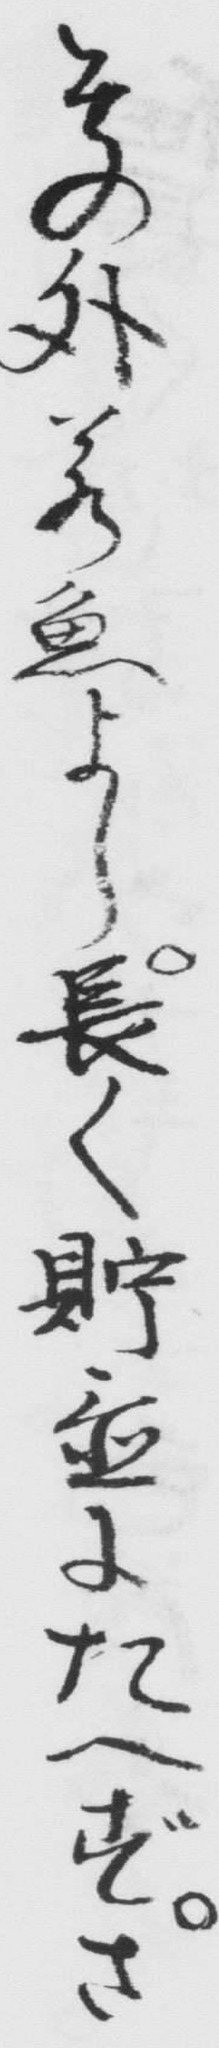その外若魚よし。長く貯置にたへず。さ
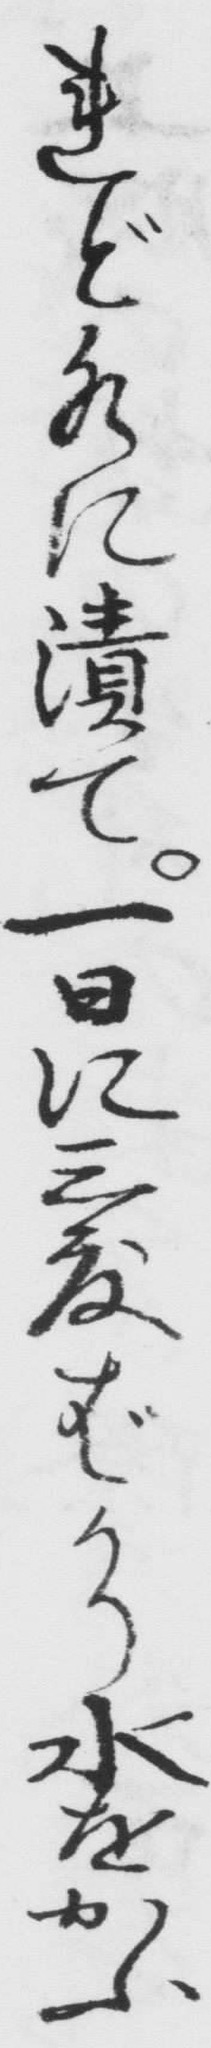れど水に漬て。一日に三度ばかり水をかふ
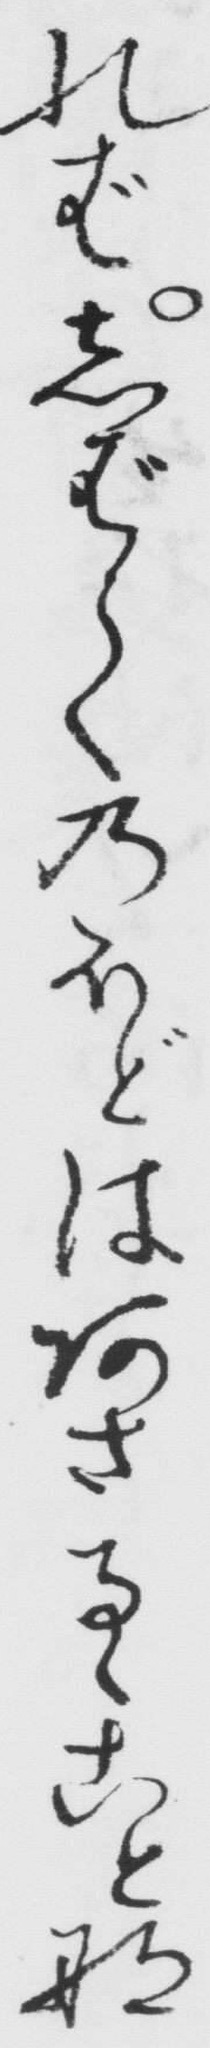れば。しばらくのほどはあさるゝことな
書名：鯨肉調味方
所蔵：大阪府立大学学術情報センター 国文学研究資料館
